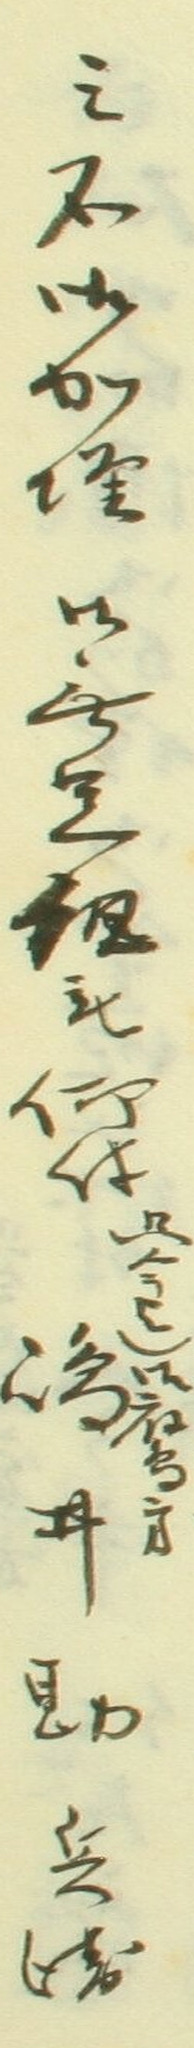三石御加増御無足組被仰付同

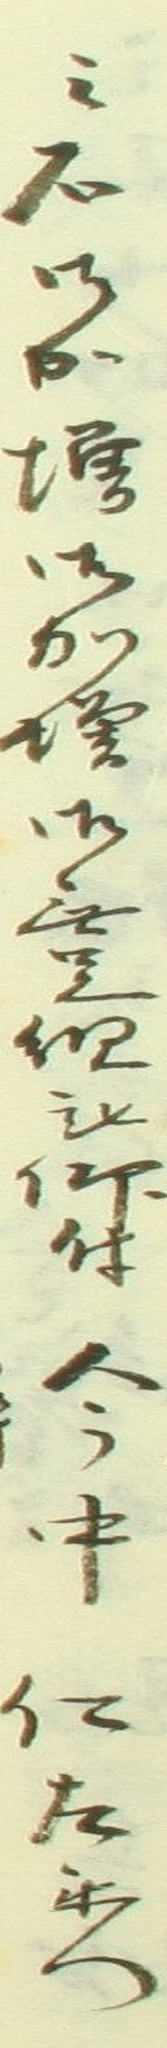三石御加増御加増御無足組被仰付只今迠御府島方
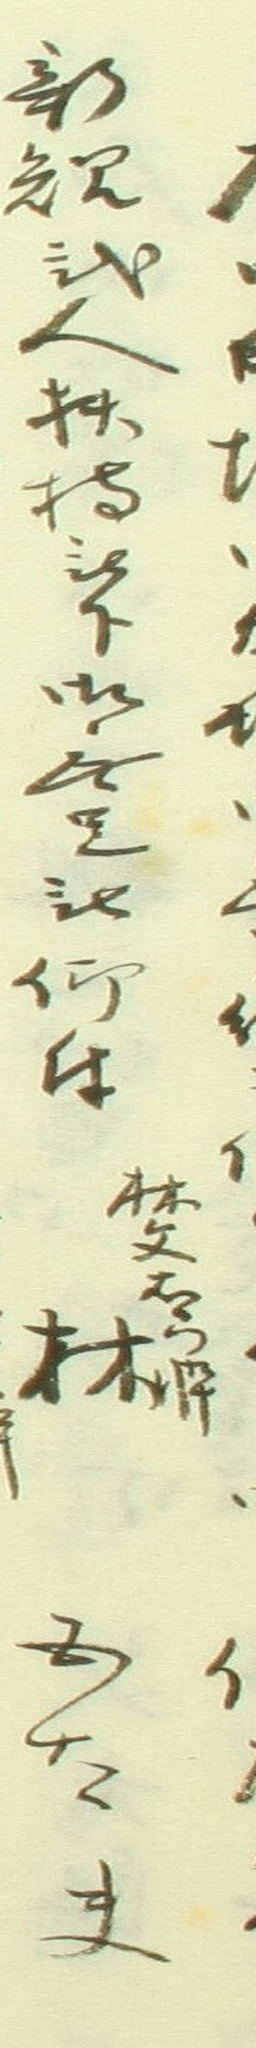新規弐人扶持被下御無足被仰付林文右衛門倅
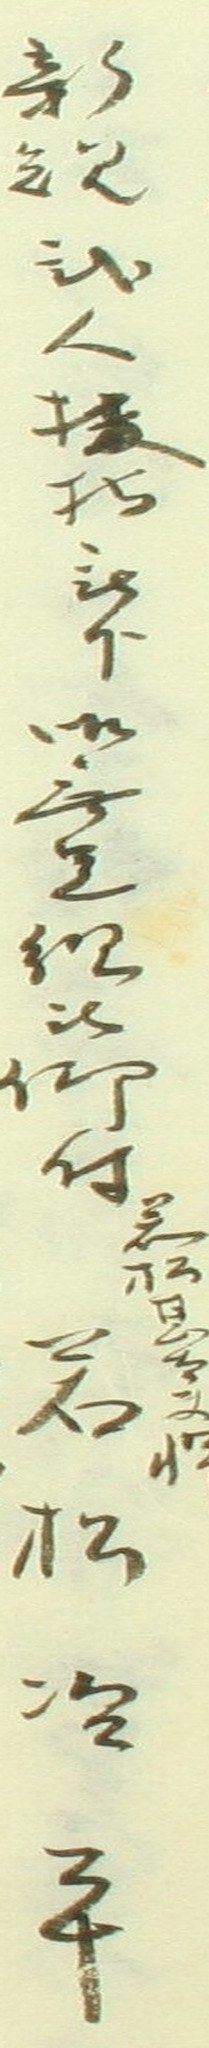新規弐人扶持被下御無足組被仰付若松甚右衛門倅
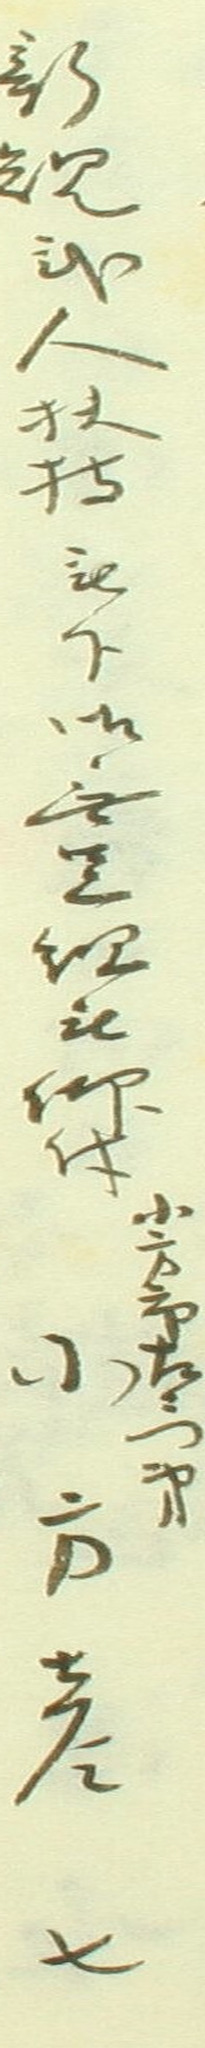新規弐人扶持被下御無足組被仰付小方市左衛門弟
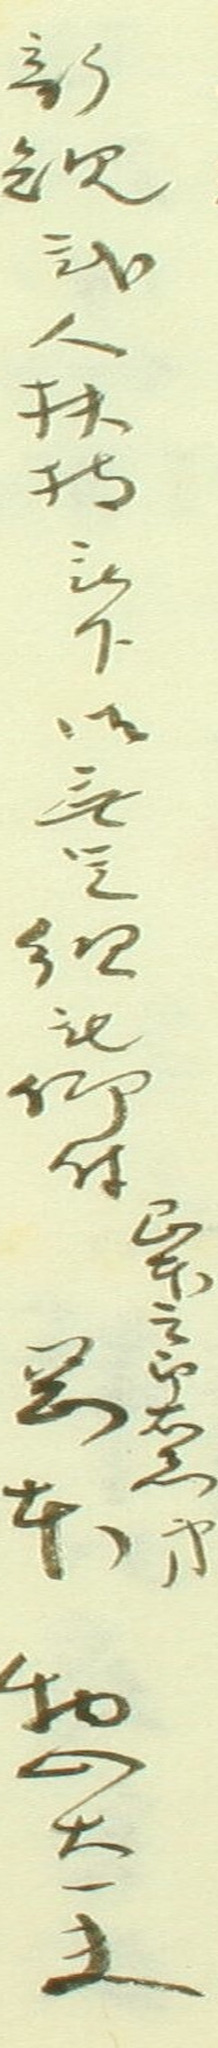新規弐人扶持被下御無足組被仰付岡本三郎右衛門弟
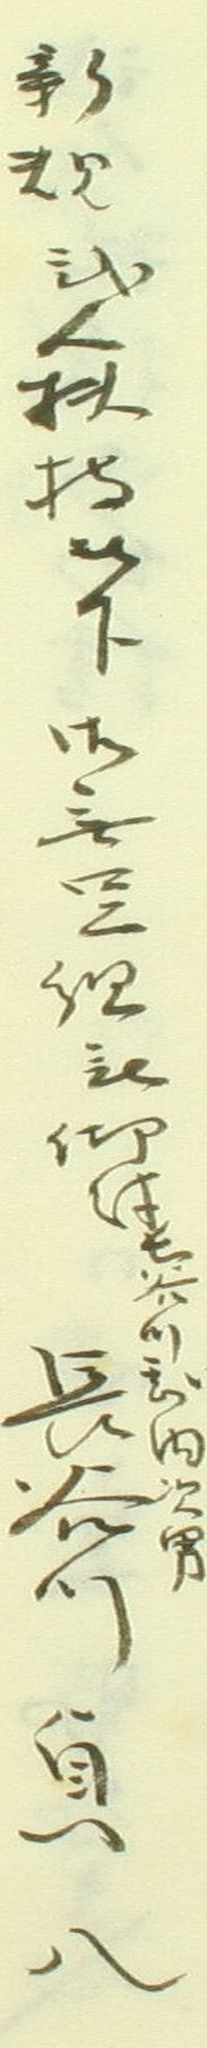新規弐人扶持被下御無足組被仰付若松甚右衛門倅
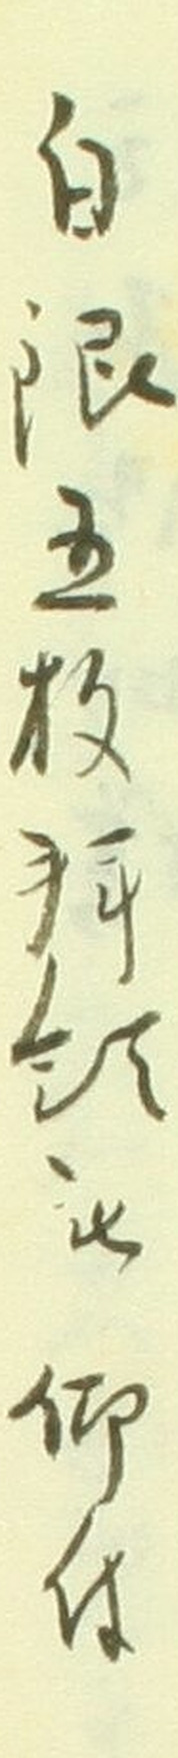白銀五枚拝領被仰付同
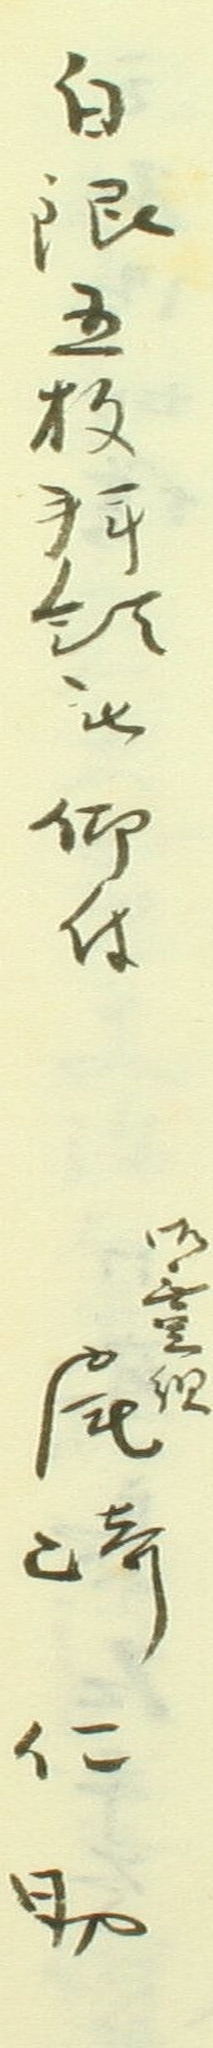白銀五枚拝領被仰付御無足組
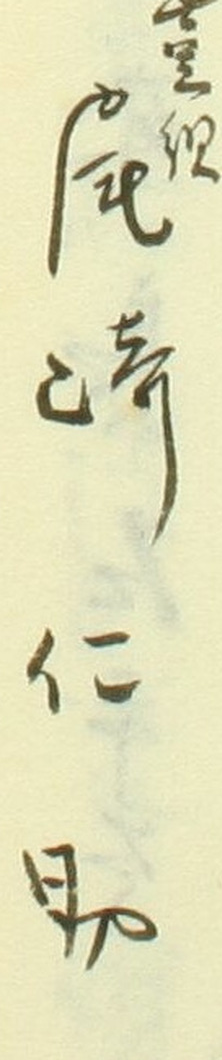尾崎仁助
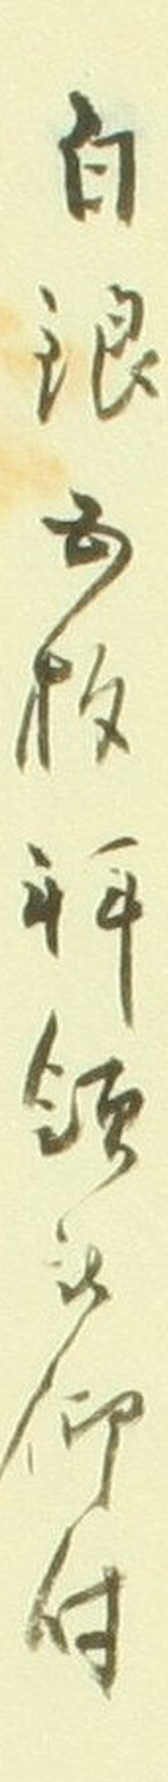白銀五枚拝領被仰付同
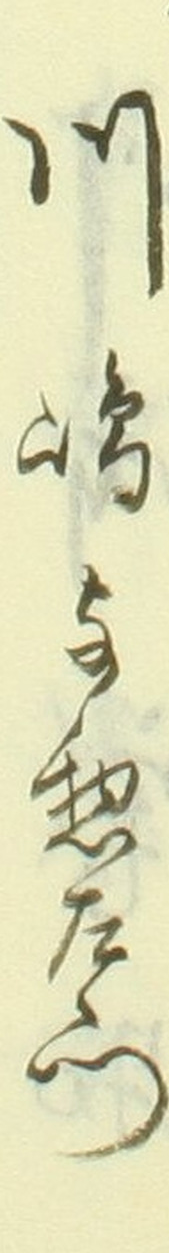川嶋与惣左衛門
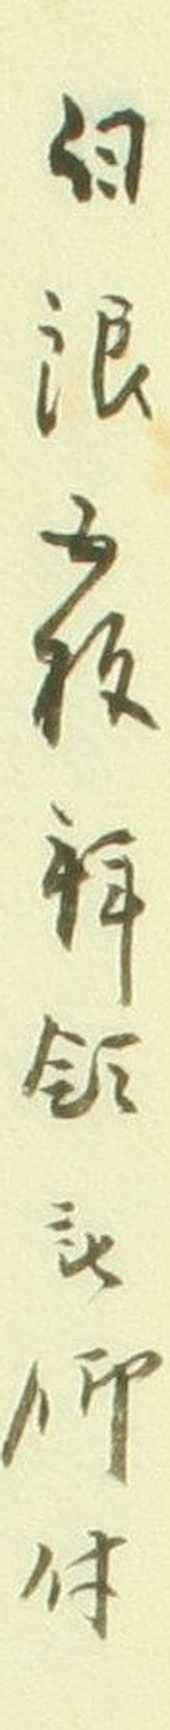白銀五枚拝領被仰付同
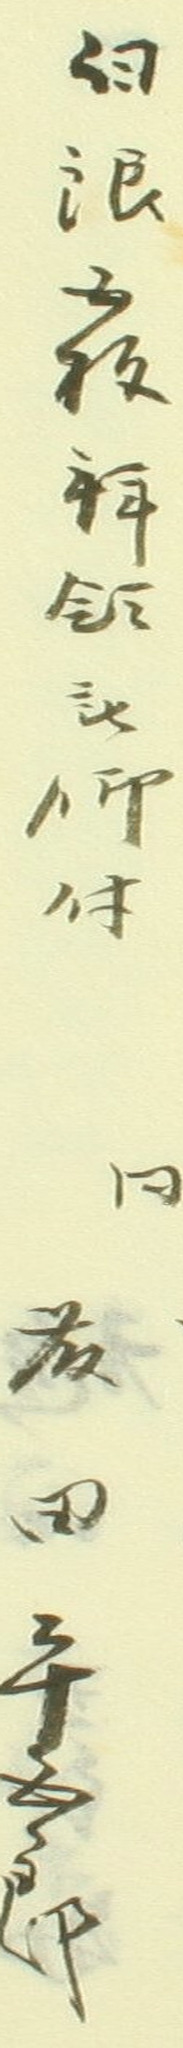白銀五枚拝領被仰付御無足組
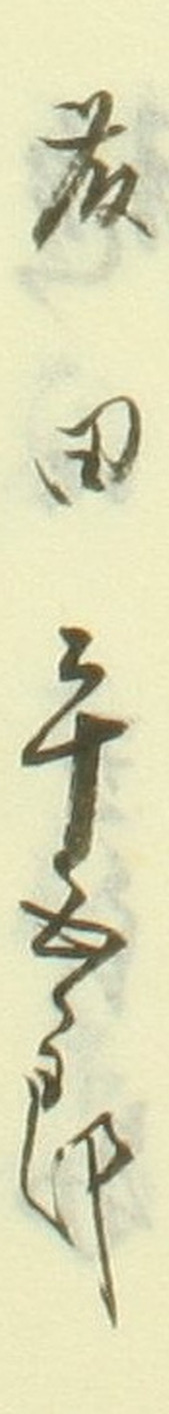藤田平五郎
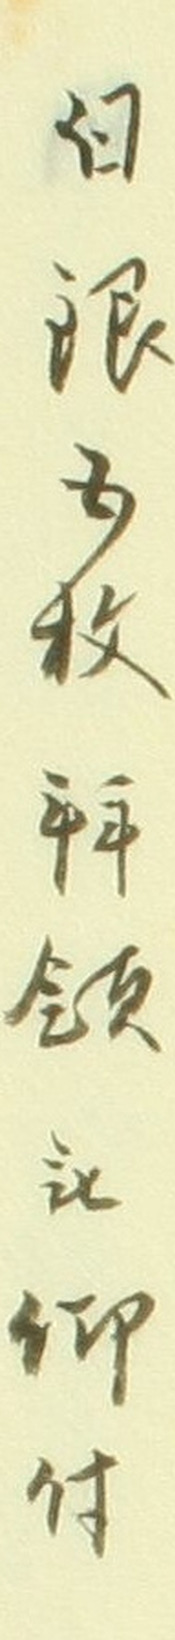白銀五枚拝領被仰付同
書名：唐船漂流記 三
